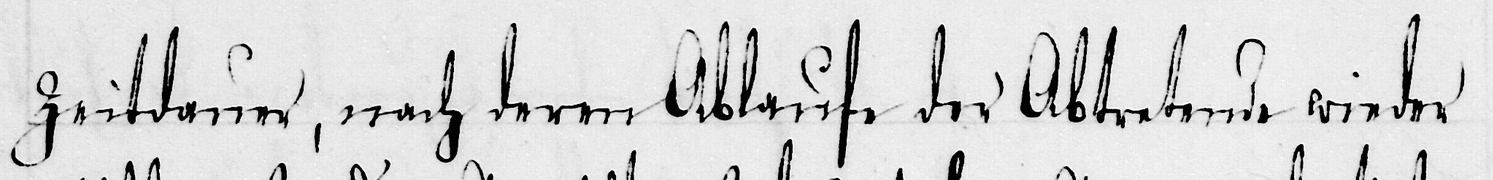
Zeitdauer, nach deren Ablaufe der Abtretende wieder
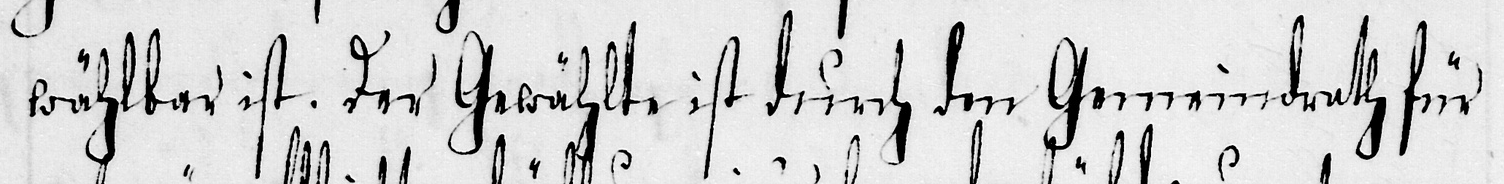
wählbar ist. Der Gewählte ist durch den Gemeindrath für
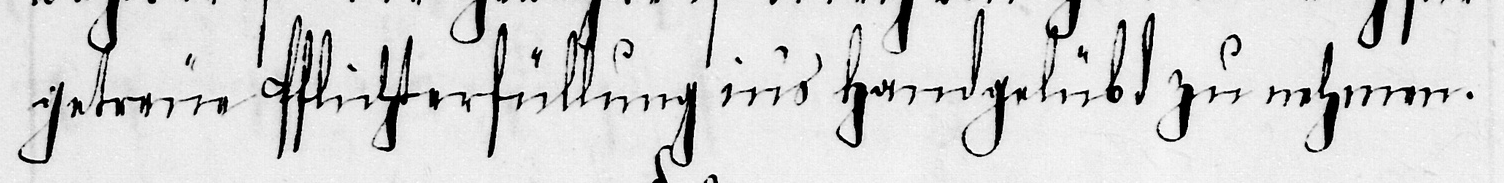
getreue Pflichterfüllung in’s Handgelübd zu nehmen.
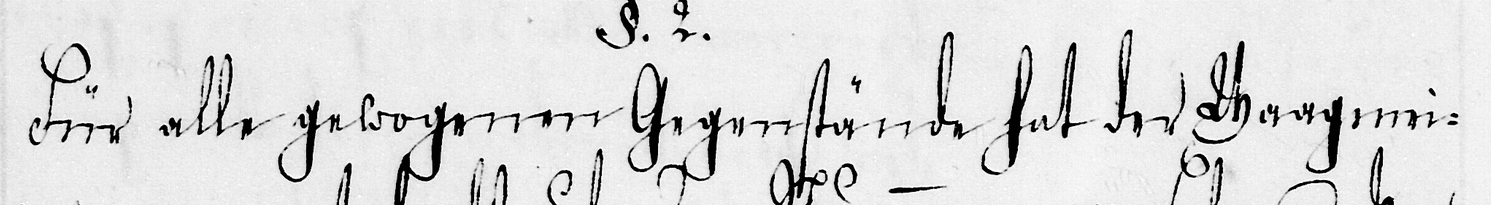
Für alle gewogenen Gegenstände hat der Waagmei¬
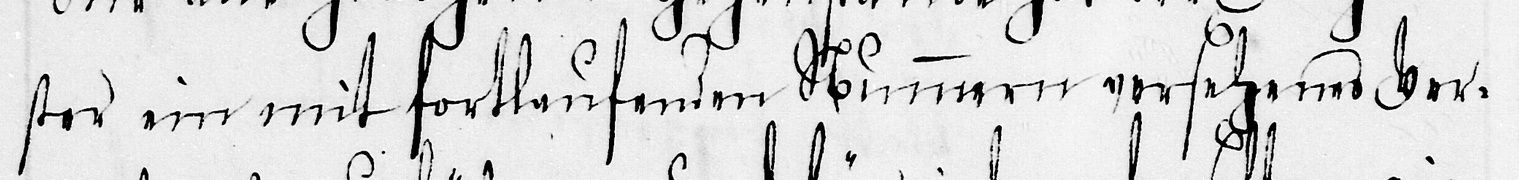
ster ein mit fortlaufenden Nummern versehenes Ver¬
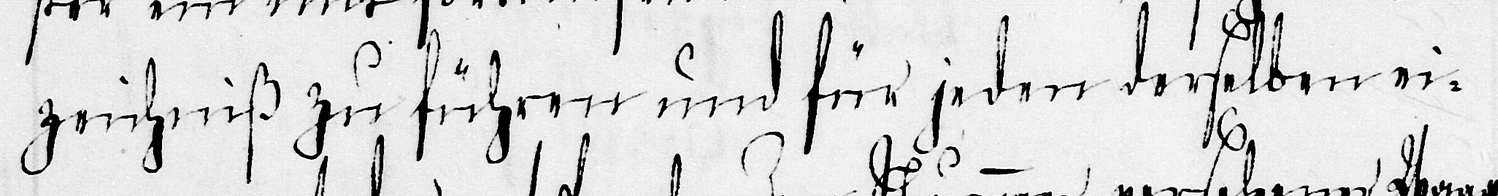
zeichniß zu führen und für jeden derselben ei¬
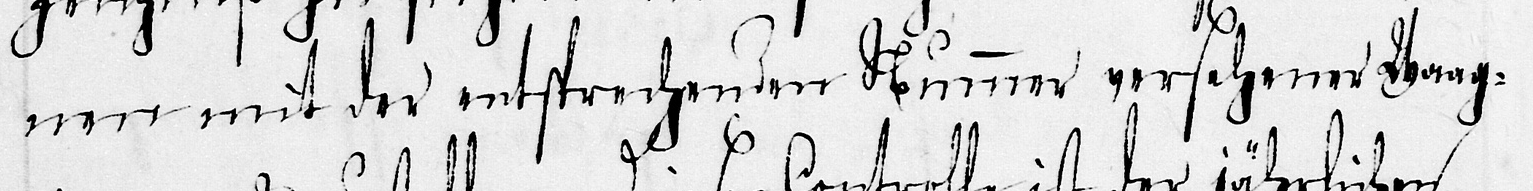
nen mit der entsprechenden Nummer versehener Waag¬
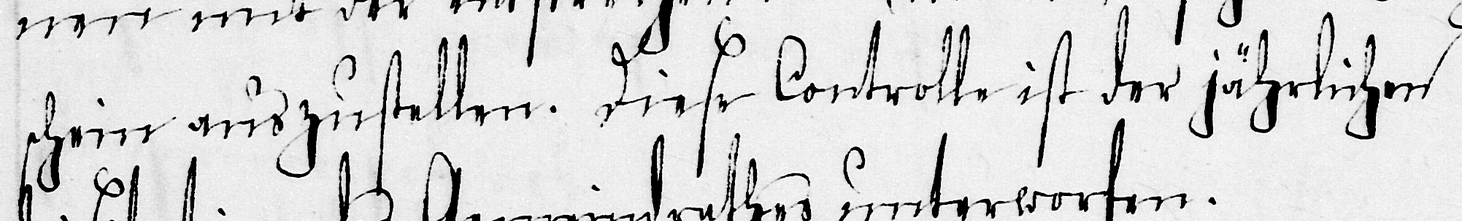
schein auszustellen. Diese Controlle ist der jährlichen
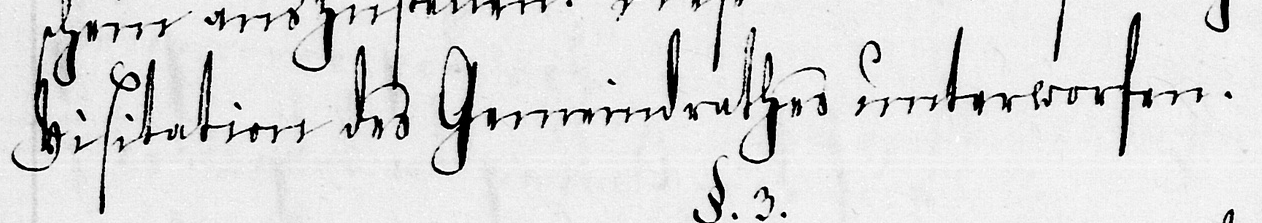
Visitation des Gemeindrathes unterworfen.
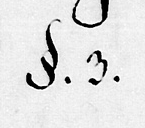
§. 3.
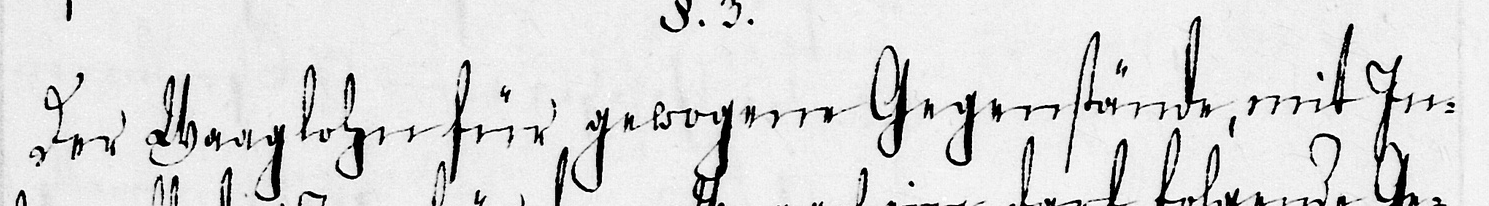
Der Waaglohn für gewogene Gegenstände, mit In¬
